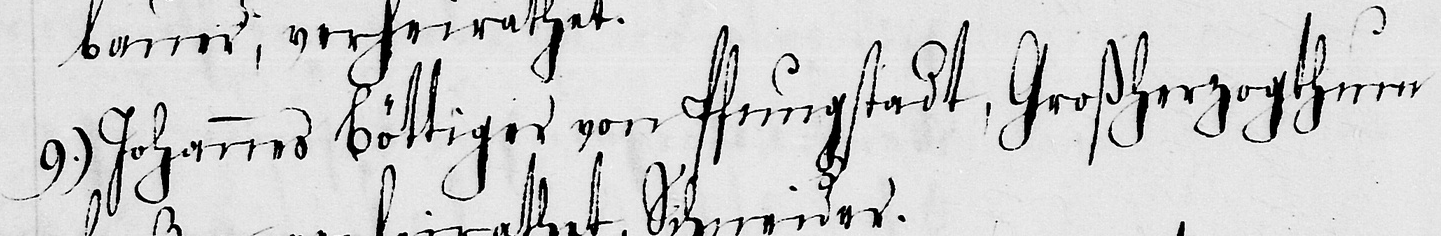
9.) Johannes Böttiger von Pfungstadt, Großherzogthum
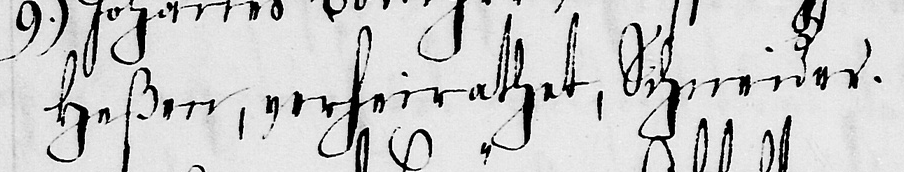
Heßen, verheirathet, Schneider.
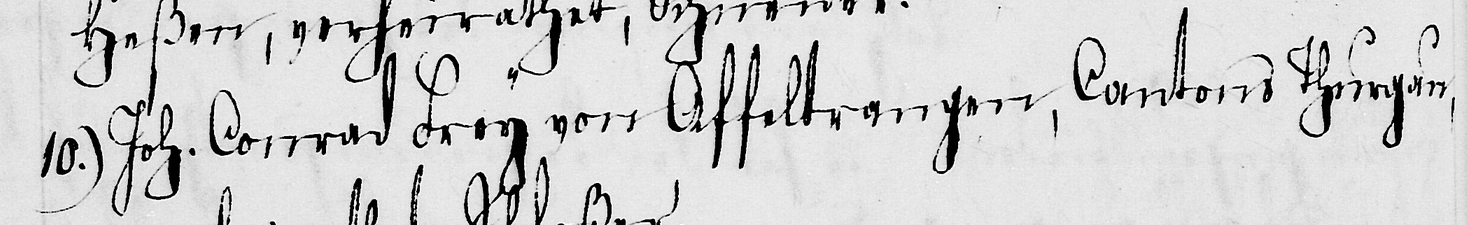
10.) Joh. Conrad Frey von Affeltrangen, Cantons Thurgau,
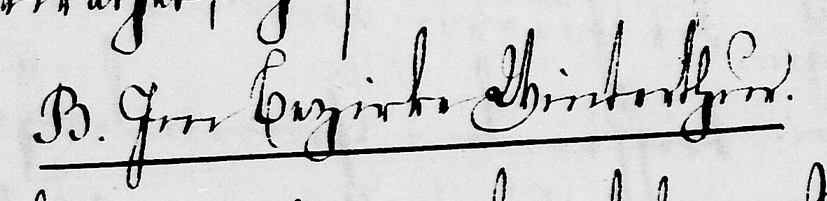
B. Im Bezirke Winterthur.
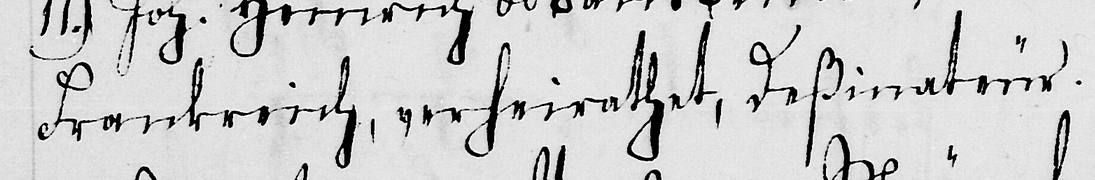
Frankreich, verheirathet, Deßinateur.
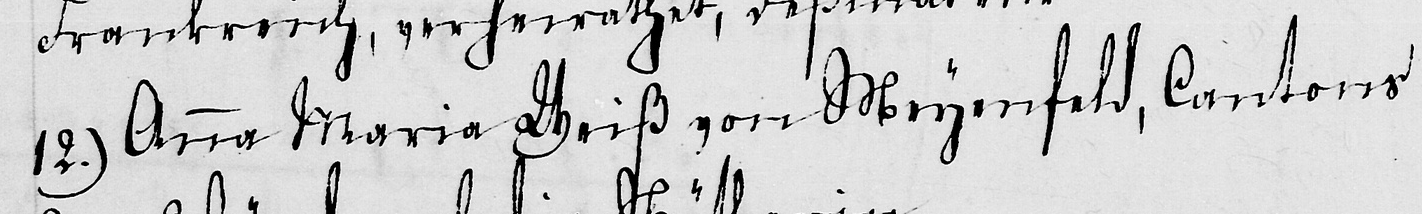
12.) Anna Maria Weiß von Meyenfeld, Cantons
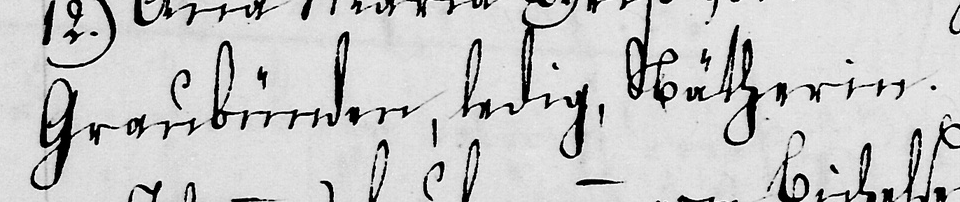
Graubünden, ledig, Nätherin.
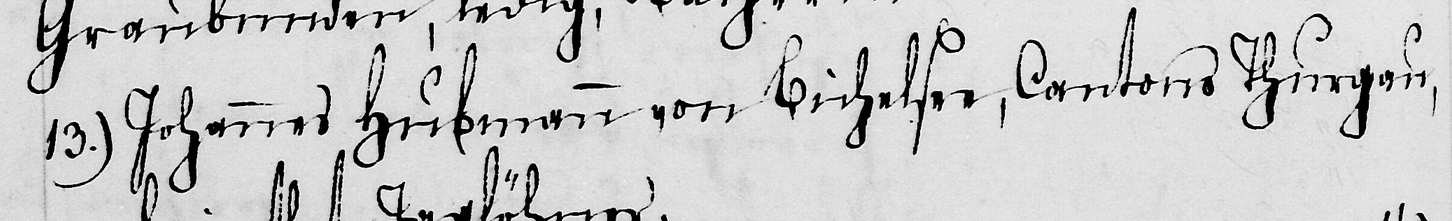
13.) Johannes Hubmann von Bichelsee, Cantons Thurgau,
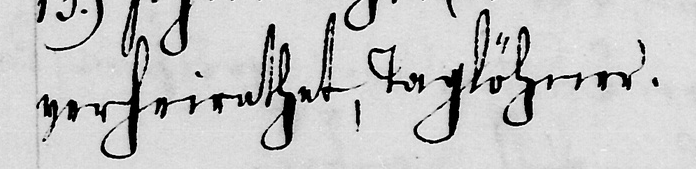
verheirathet, Tagelöhner.
